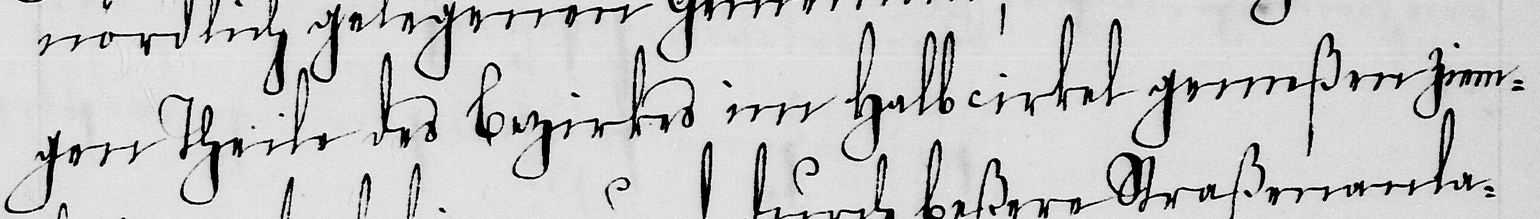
gen Theile des Bezirkes im Halbcirkel gemeßen ziem¬
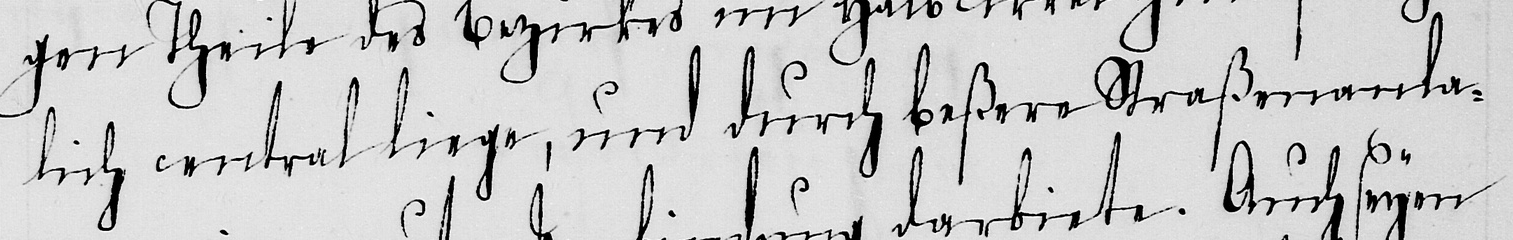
lich central liege, und durch beßere Straßenanla¬
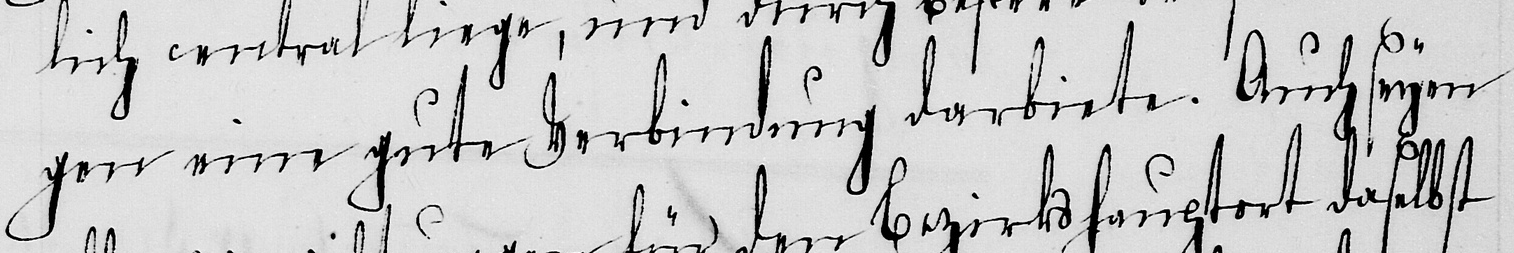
gen eine gute Verbindung darbiete. Auch seyen
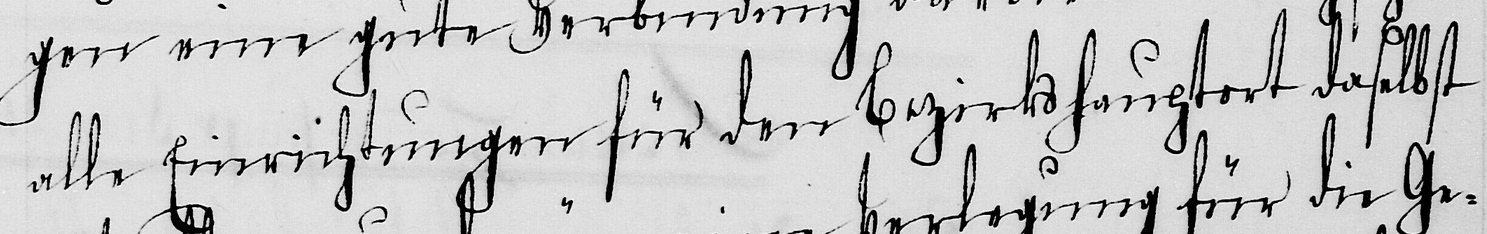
alle Einrichtungen für den Bezirkshauptort daselbst
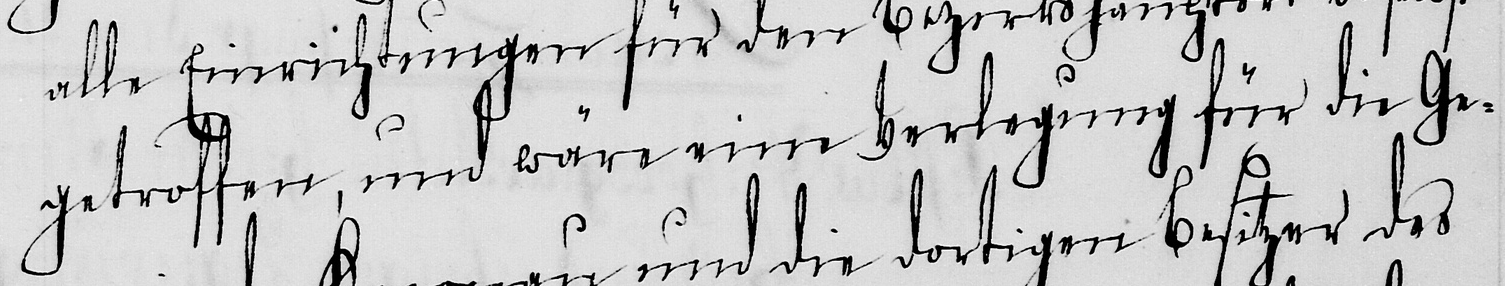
getroffen, und wäre eine Verlegung für die Ge¬
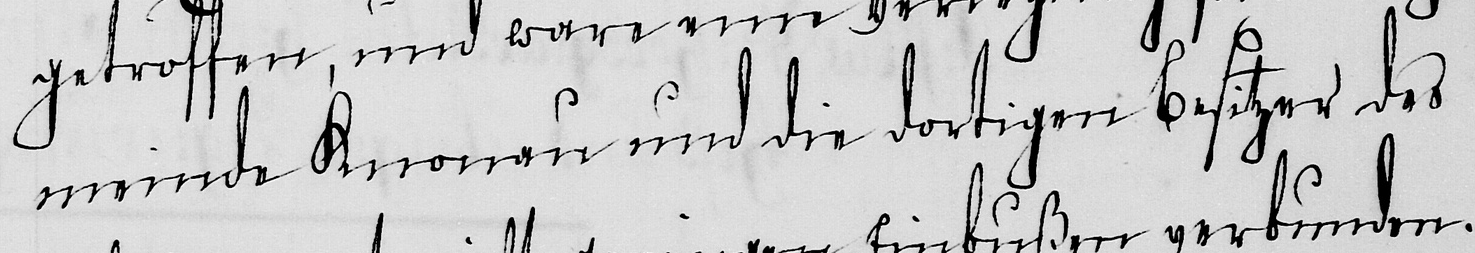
meinde Knonau und die dortigen Besitzer des
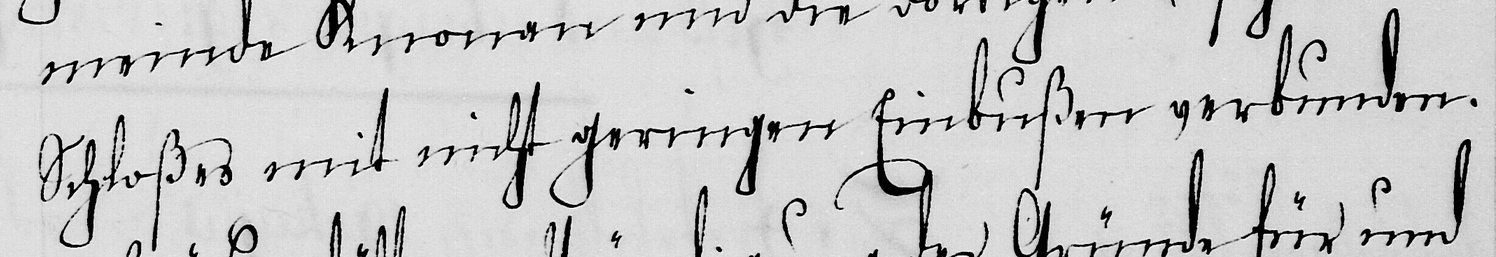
Schloßes mit nicht geringen Einbußen verbunden.
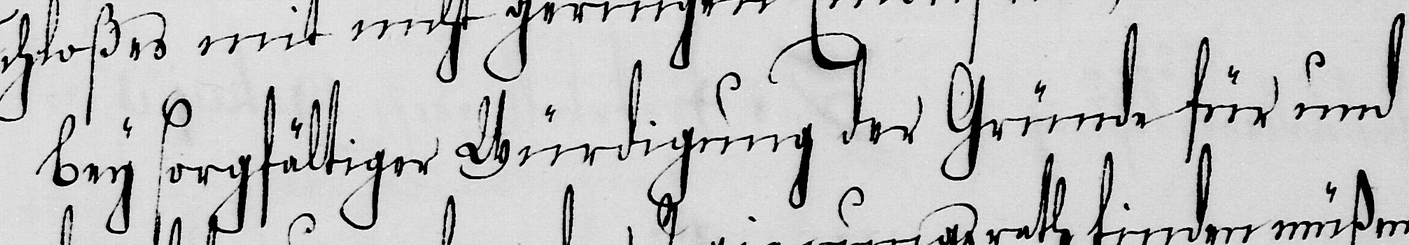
Bey sorgfältigerer Würdigung der Gründe für und
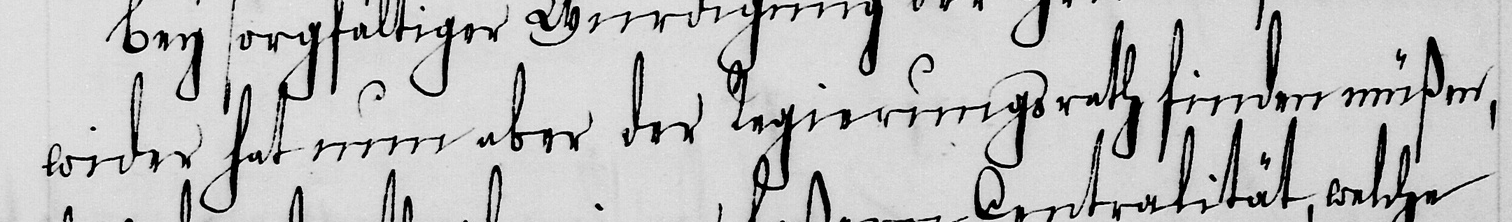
wider hat nun aber der Regierungsrath finden müßen,
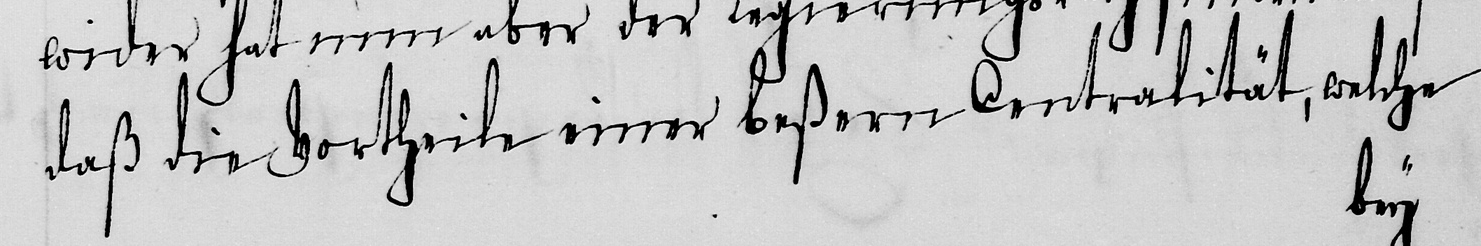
daß die Vortheile einer beßern Centralität, welche
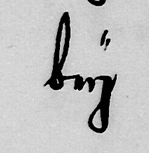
bey¬
